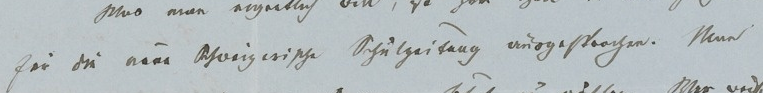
für die neue Schweizerische Schulzeitung ausgesprochen. Man
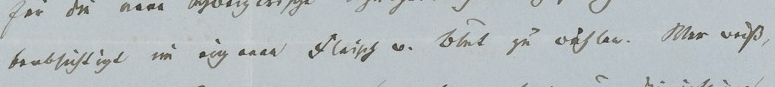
beabsichtigt im eigenen Fleisch u. Blut zu wühlen. Wer weiß,
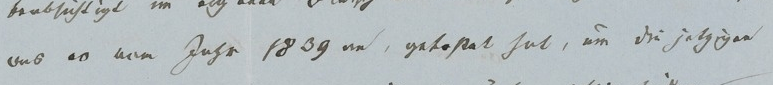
was es vom Jahr 1839 an, gekostet hat, um die jetzigen
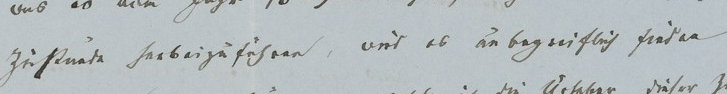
Zustände herbeizuführen, wird es unbegreiflich finden,
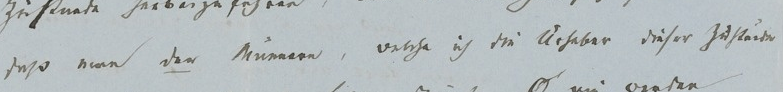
daß man den Männern, welche ich die Urheber dieser Zustände
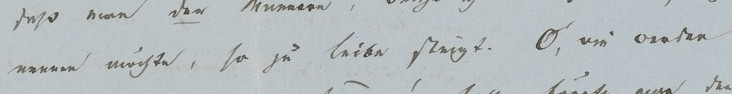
nennen möchte, so zu Leibe steigt. O, wie werden
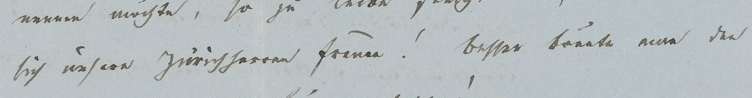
sich unsere Zürichherren freuen! Besser könnte man den
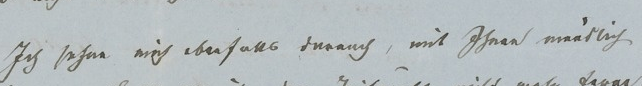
Ich sehne mich ebenfalls darnach, mit Ihnen mündlich
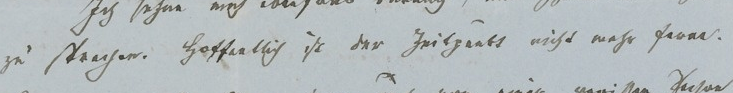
zu sprechen. Hoffentlich ist der Zeitpunkt nicht mehr ferne.
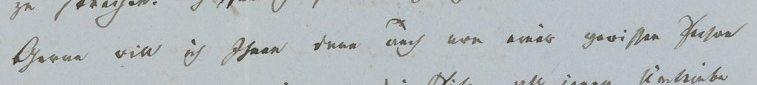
Gerne will ich Ihnen dann auch von einer gewissen Person
